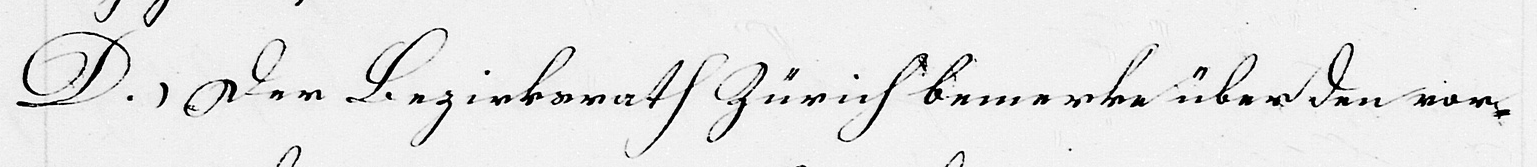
D.) Der Bezirksrath Zürich bemerke über den vor¬
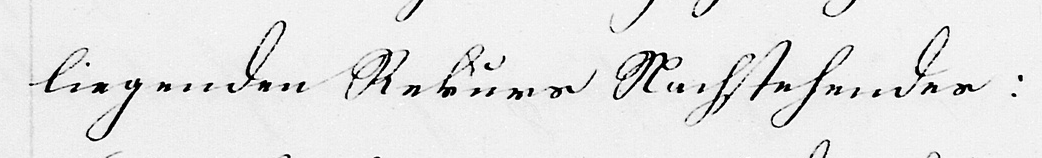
liegenden Rekurs Nachstehendes:
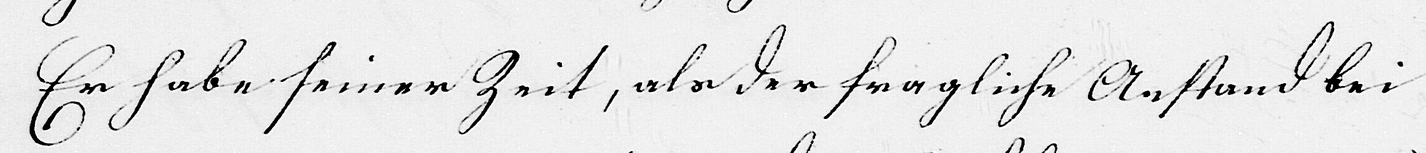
Er habe seiner Zeit, als der fragliche Anstand bei
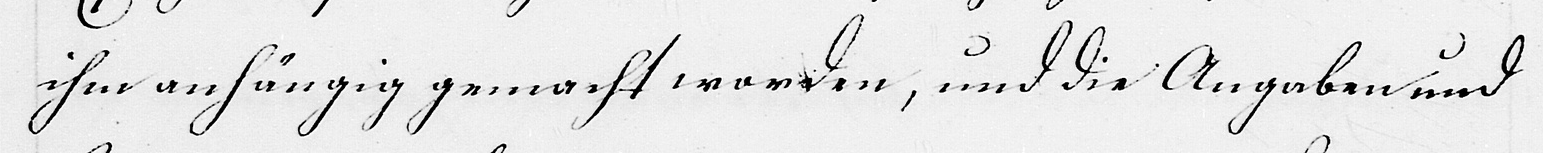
ihm anhängig gemacht worden, und die Angaben und
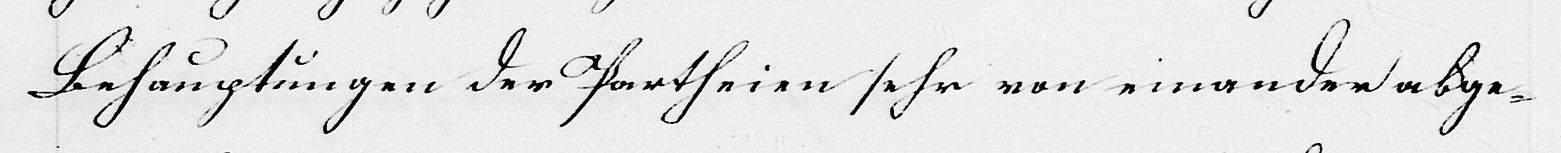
Behauptungen der Partheien sehr von einander abge¬
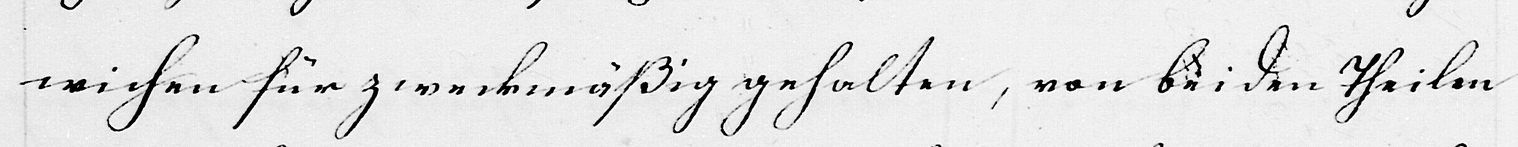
wichen für zweckmäßig gehalten, von beiden Theilen
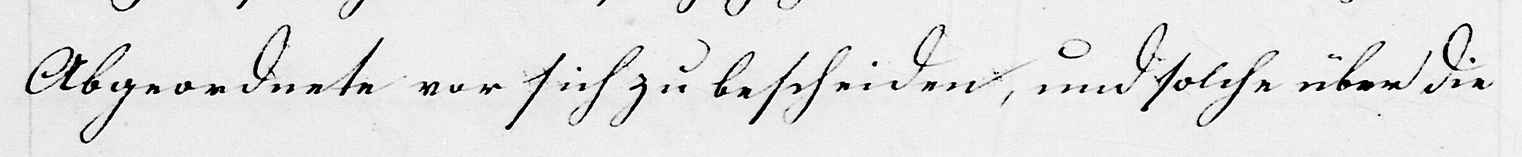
Abgeordnete vor sich zu bescheiden, und solche über die
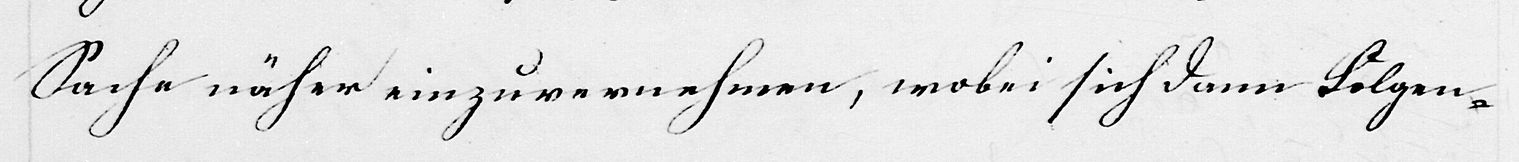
Sache näher einzuvernehmen, wobei sich dann Folgen¬
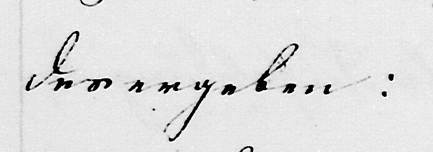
des ergeben:
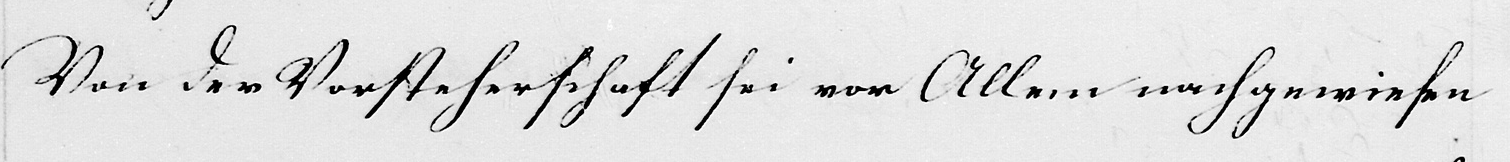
Von der Vorsteherschaft sei vor Allem nachgewiesen
